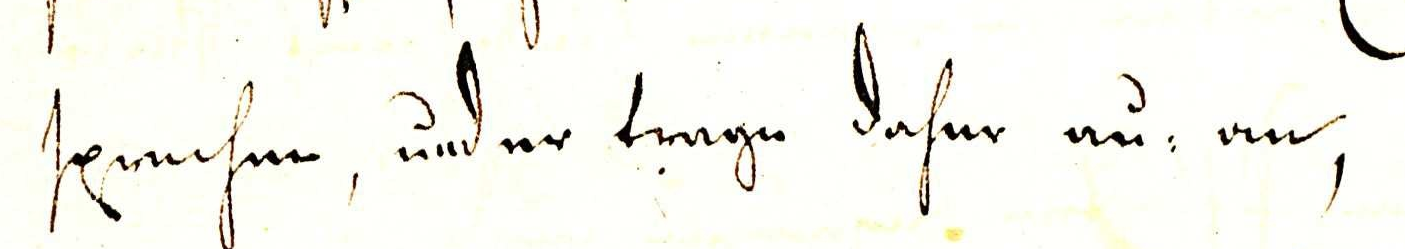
sprechen, und er trage daher au: an,
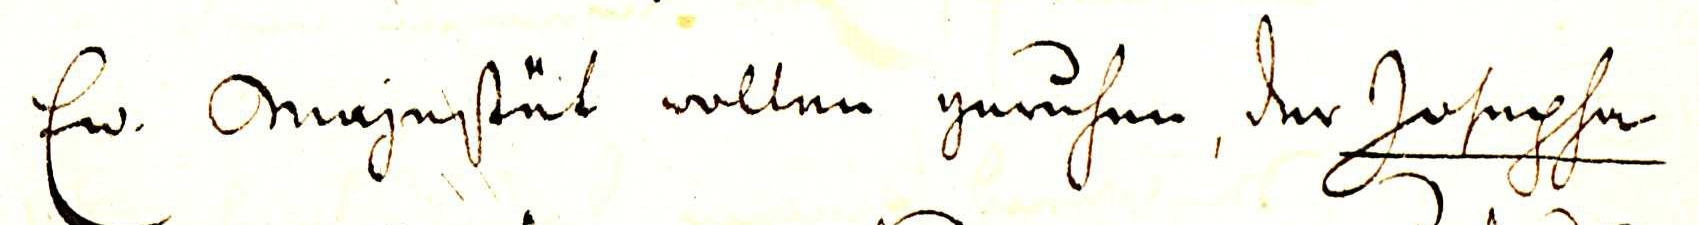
Ew. Majestät wollen geruhen, der Josepha
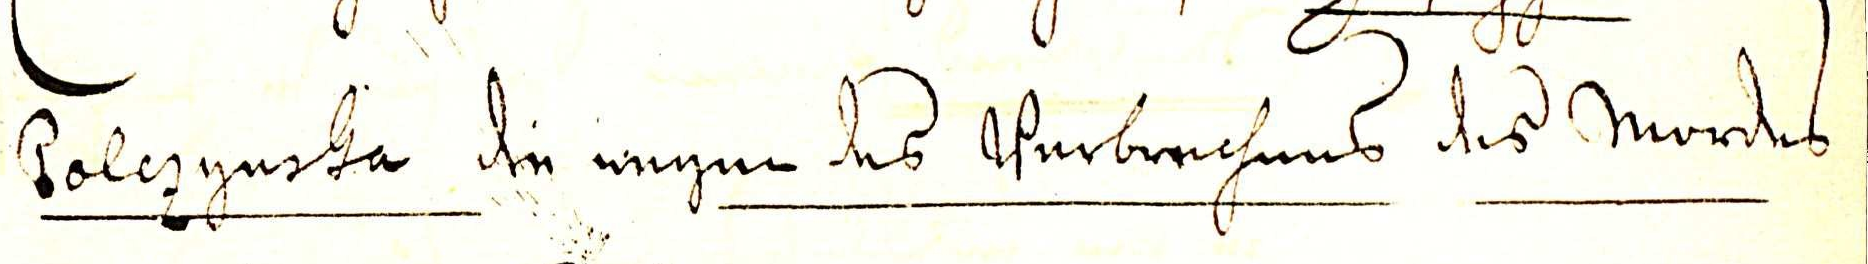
Polczynska die wegen des Verbrechens des Mordes
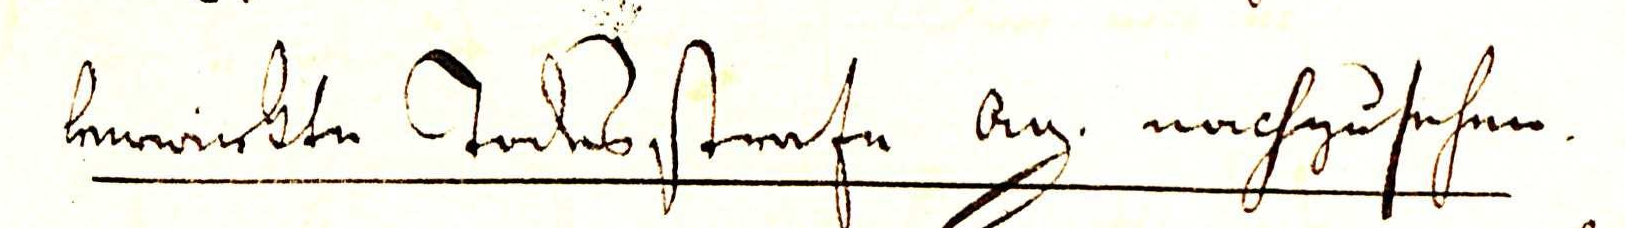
bewirkte Todesstrafe ag nachzusehen.
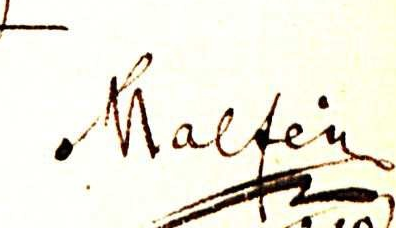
Malfei
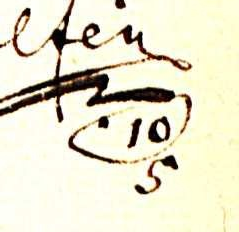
10/5
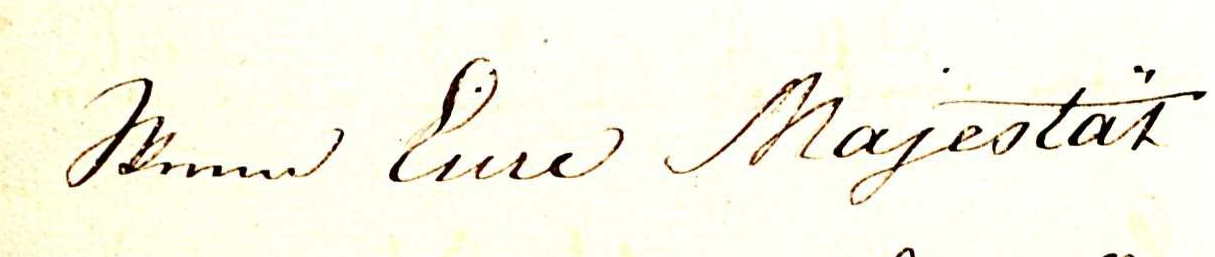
Wenn Eure Majestät
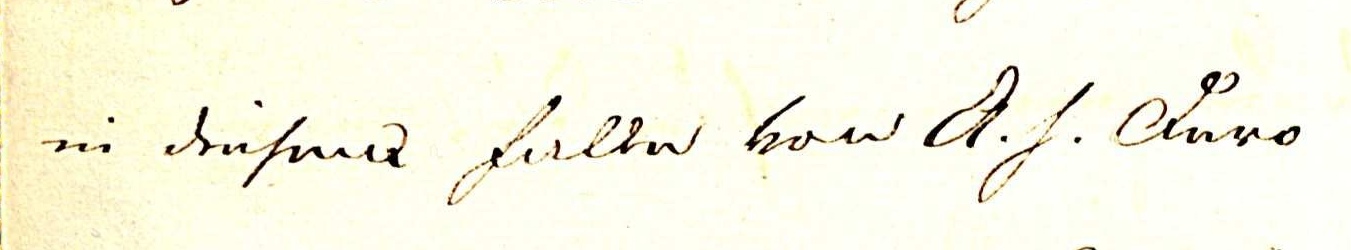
in diesem Falle von A.h. Dero
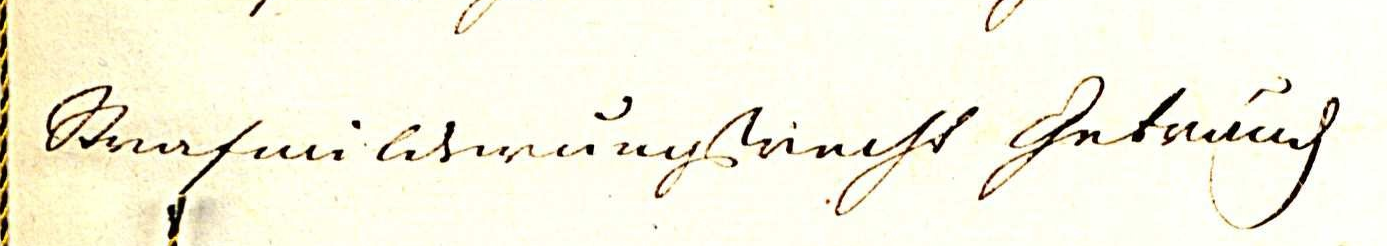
Strafmilderungsrecht Gebrauch
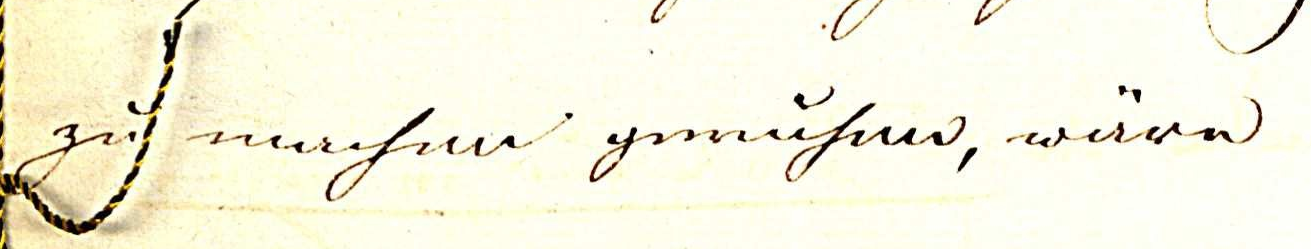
zu machen geruhen, wäre
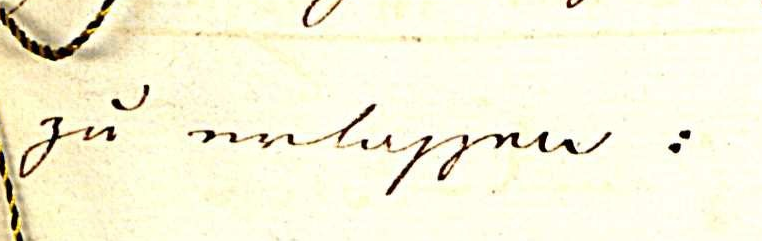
zu erlassen:
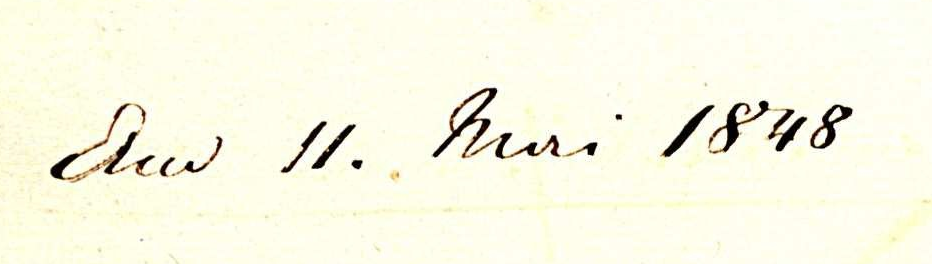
Am 11. Mai 1848
